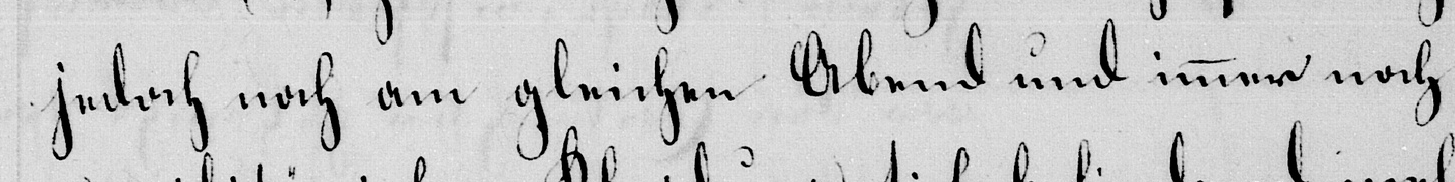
jedoch noch am gleichen Abend und immer noch
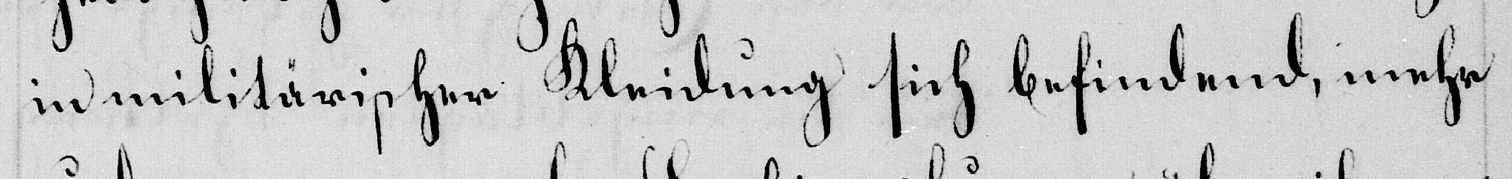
in militärischer Kleidung sich befindend, mehr
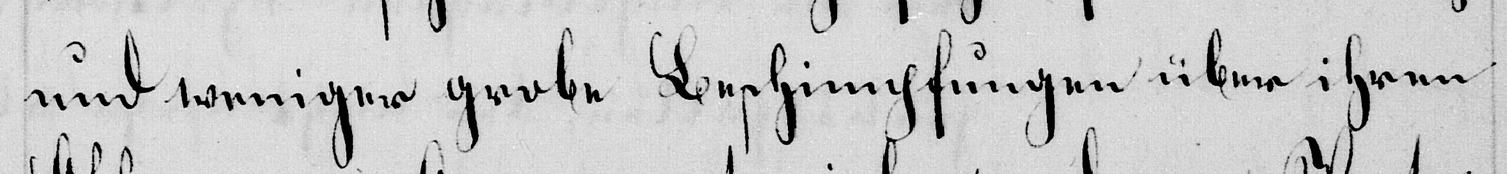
und weniger grobe Beschimpfungen über ihren
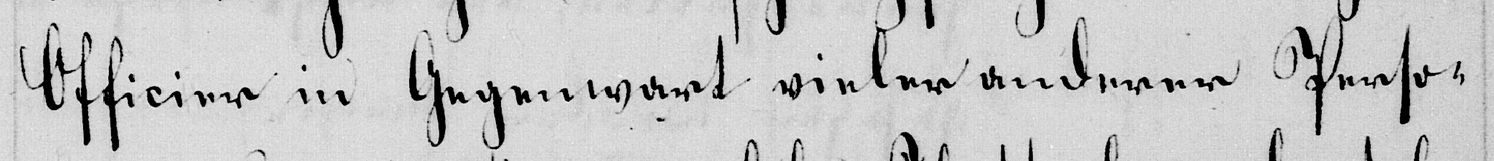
Officier in Gegenwart vieler anderer Perso¬
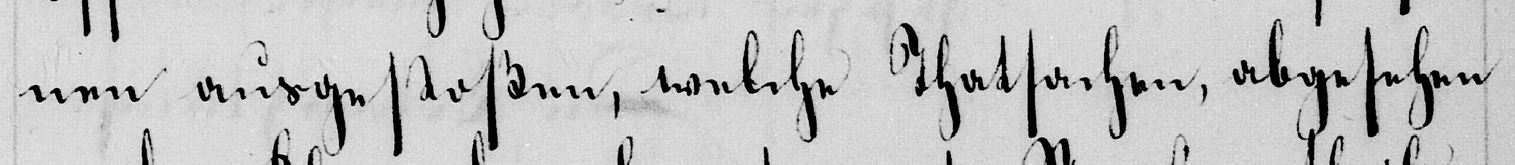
nen ausgestoßen, welche Thatsachen, abgesehen
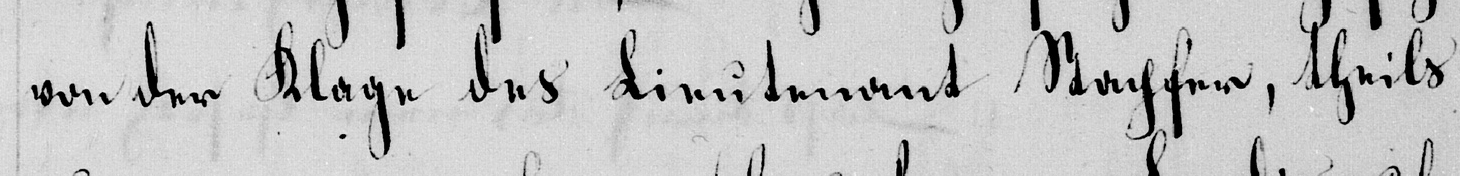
von der Klage des Lieutenant Stapfer, theils
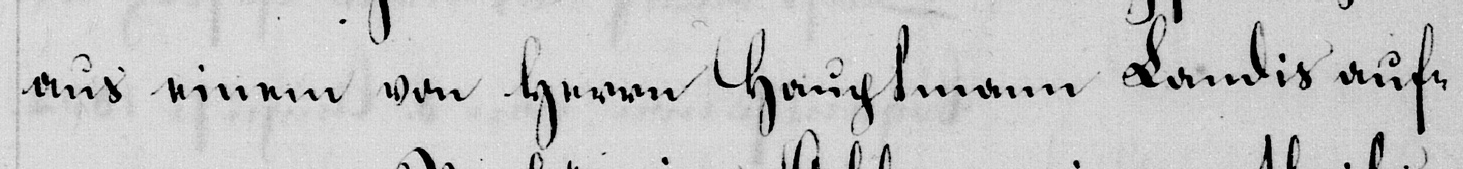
aus einem von Herrn Hauptmann Landis auf¬
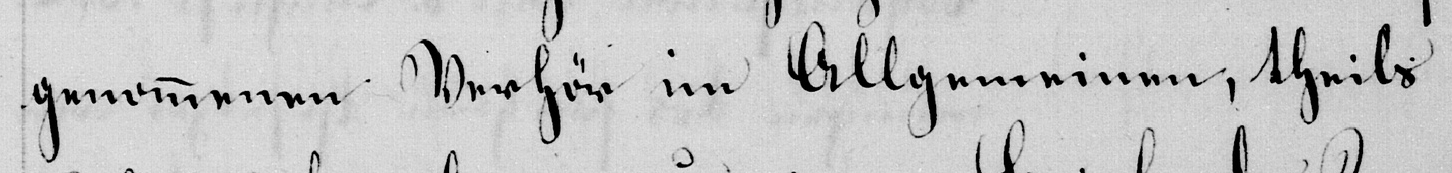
genommenen Verhör im Allgemeinen, theils
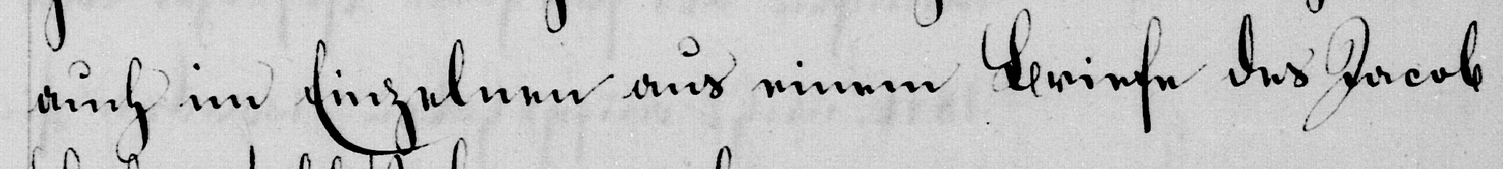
auch im Einzelnen aus einem Briefe des Jacob
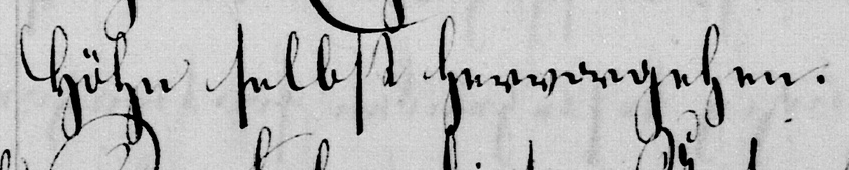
Höhn selbst hervorgehen.
